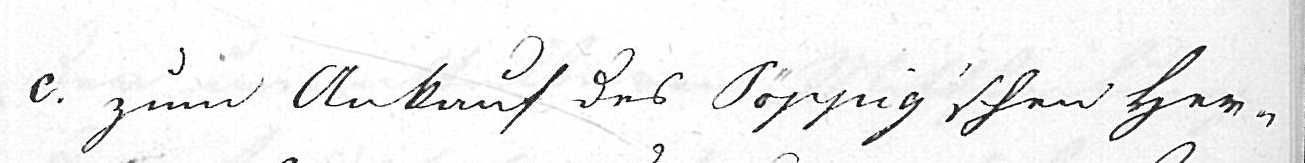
c. zum Ankauf des Pöppig'schen Her-
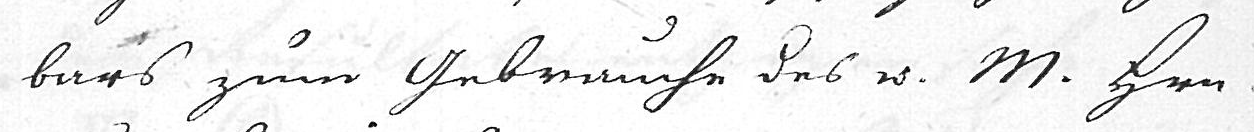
bars zum Gebrauch des w. M. Hrn.
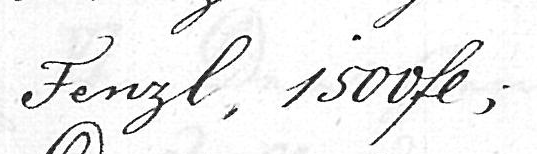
Fenzl, 1500 fl;
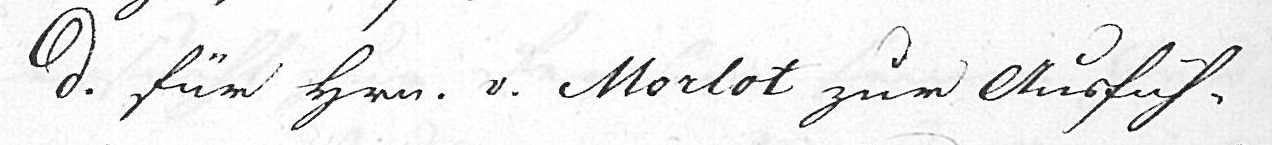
d. für Hrn. v. Morlot zur Ausfüh-
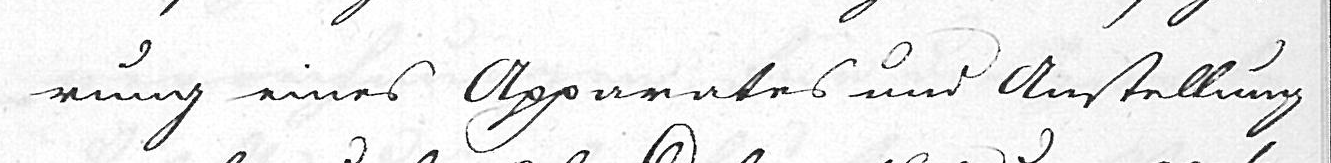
rung eines Apparates und Anstellung
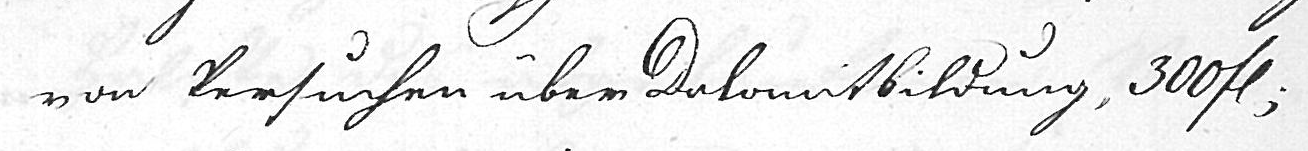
von Versuchen über Dolomitbildung, 300 fl;
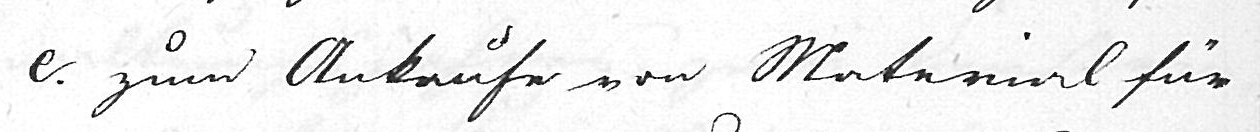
e. zum Ankaufe von Material für
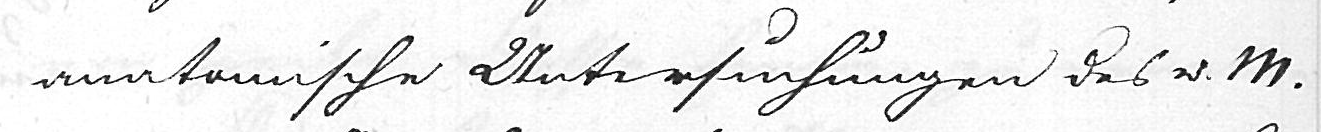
anatomische Untersuchungen des w. M.
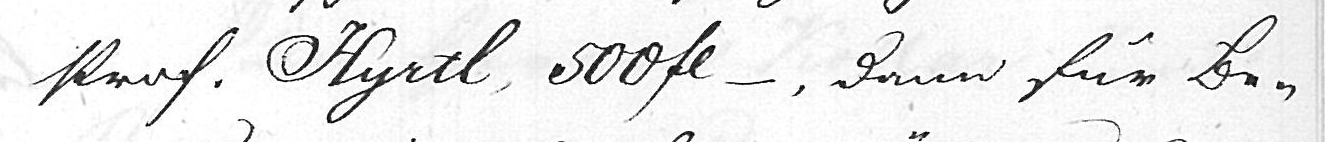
Prof. Hyrtl, 500 fl, dann für Be-
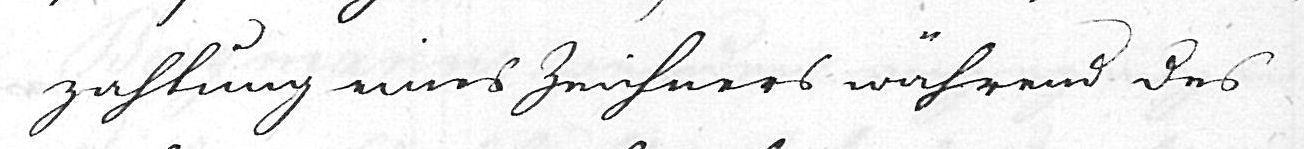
zahlung eines Zeichners während des
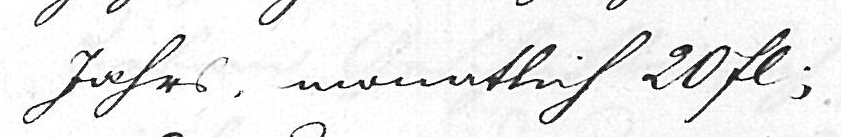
Jahrs, monatlich 20 fl;
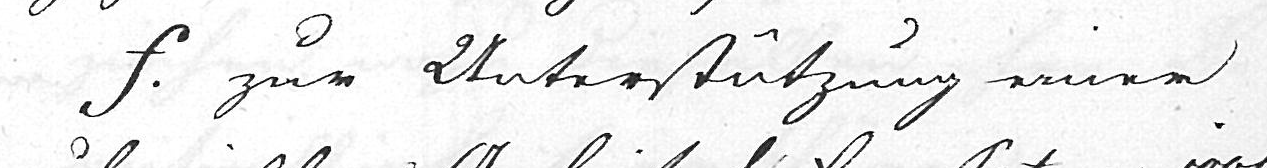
f. zur Unterstützung einer
